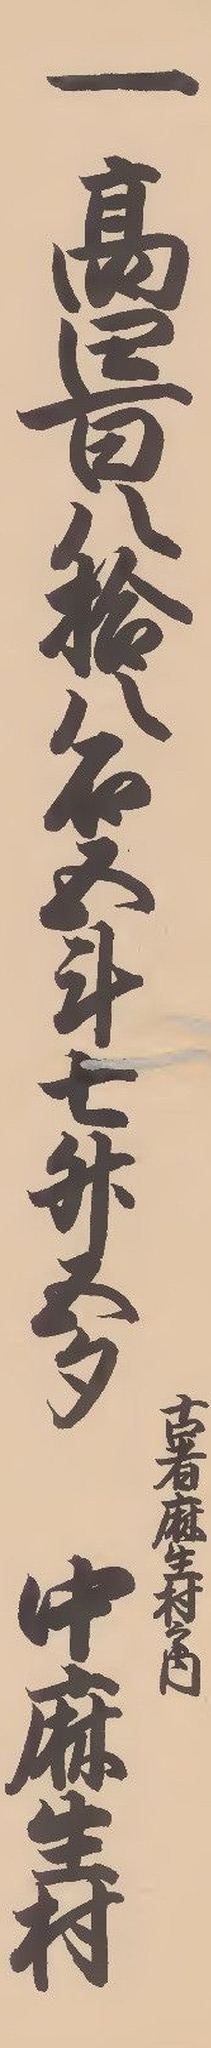一髙四百八拾八石五斗七升五夕中麻生村
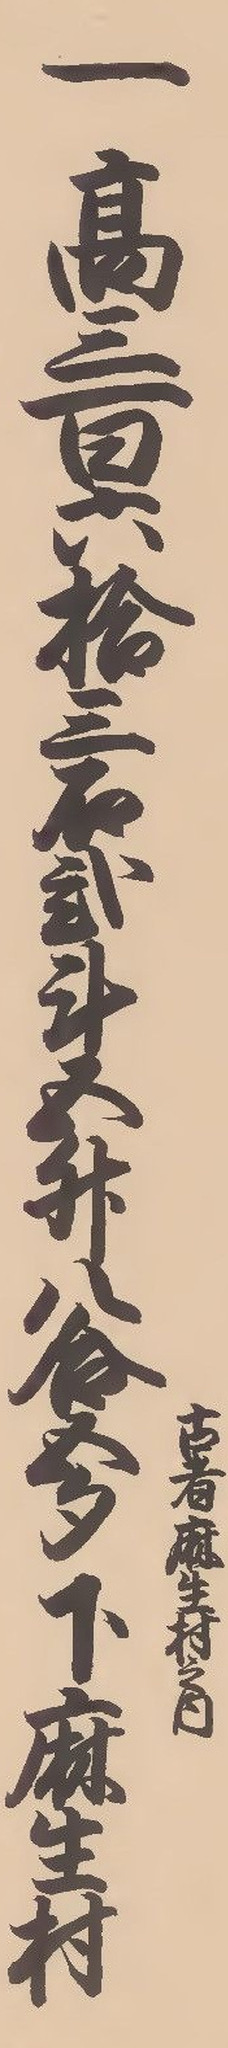一髙三百六拾三石弐斗五升八合五夕下麻生村
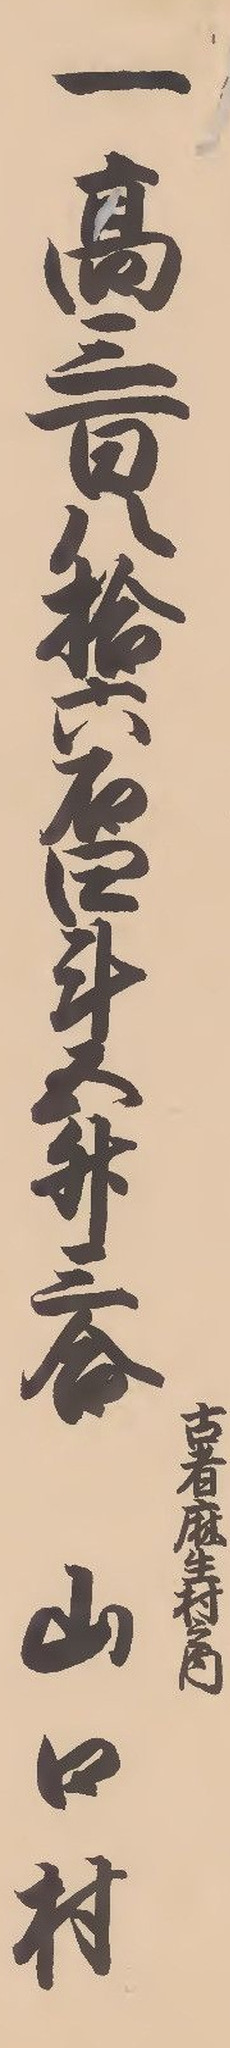一髙三百八拾六石四斗五升三合山口村
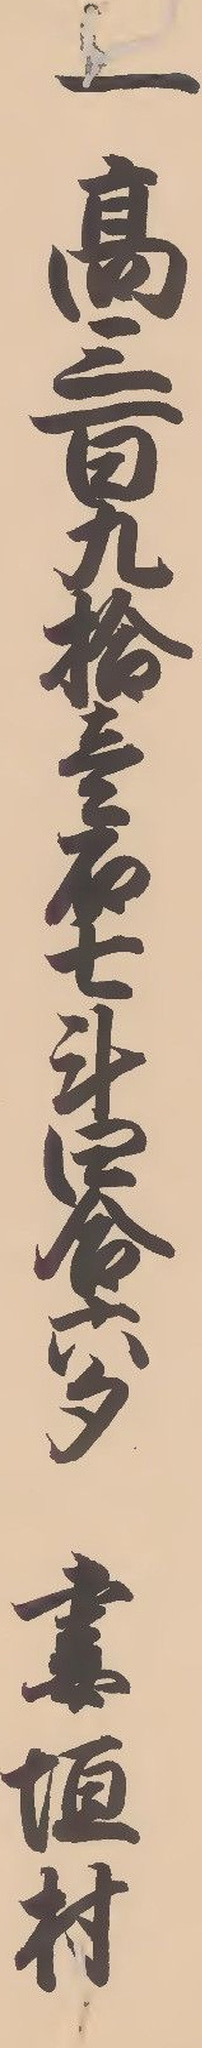一髙三百九拾壱石七斗四合六夕妻垣村
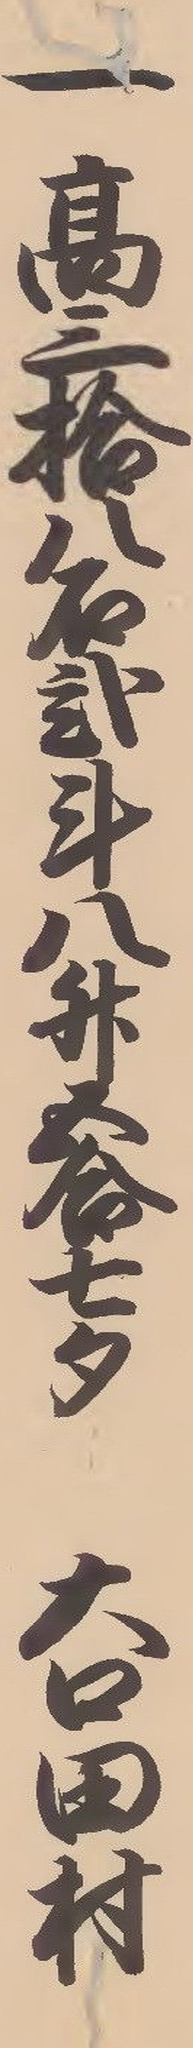一髙三拾八石弐斗八升五合七夕大口田村
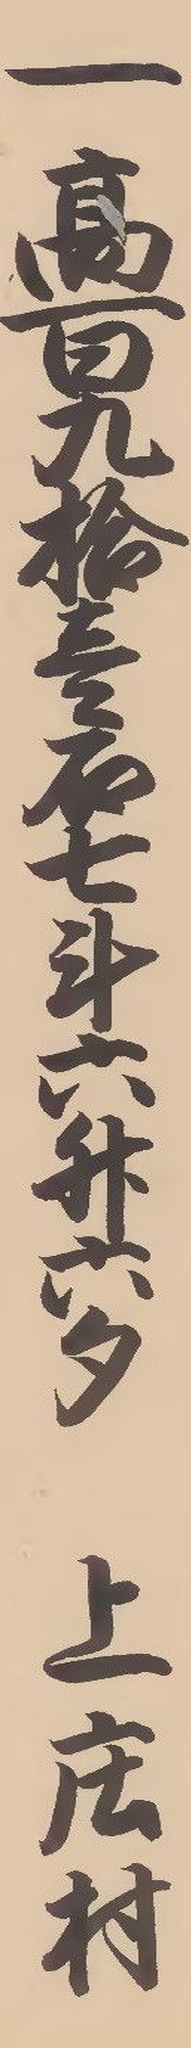一髙百九拾壱石七斗六升六夕上庄村
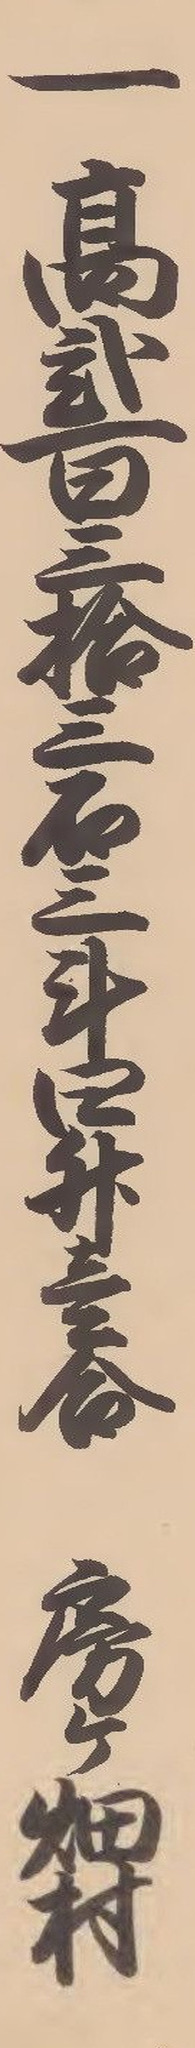一髙弐百三拾三石三斗四升壱合房ケ畑村
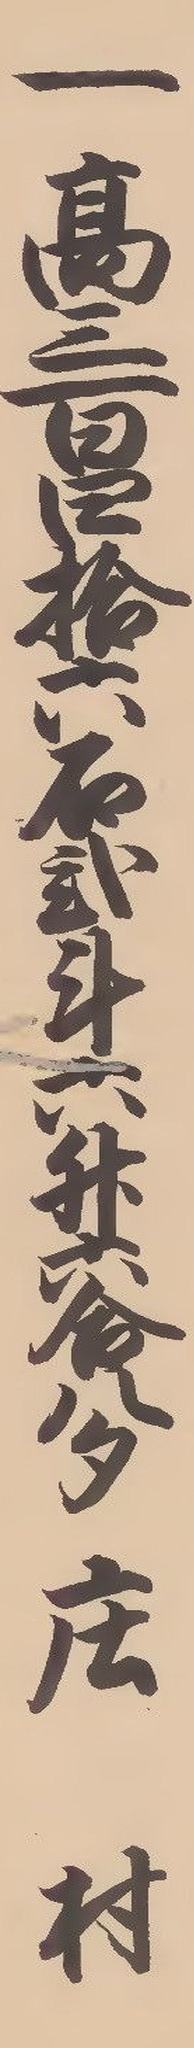一髙三百四拾六石弐斗六升六合八夕庄村

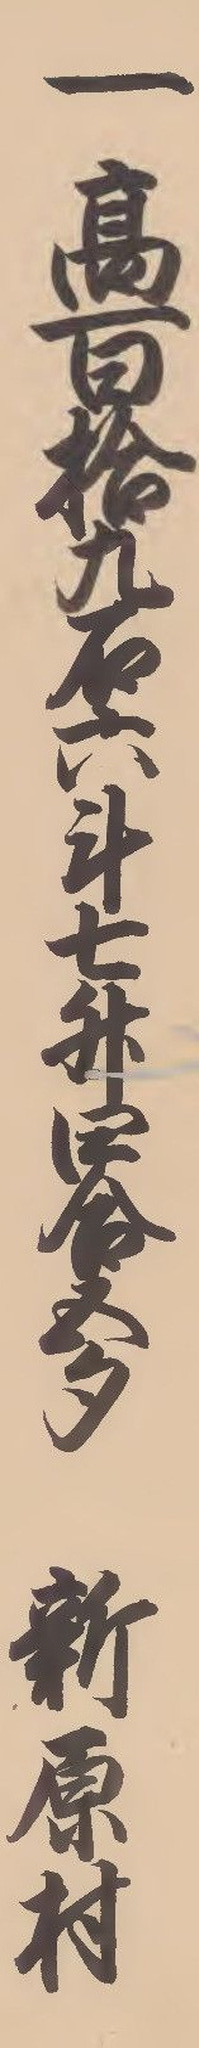一髙百拾九石六斗七升四合五夕新原村
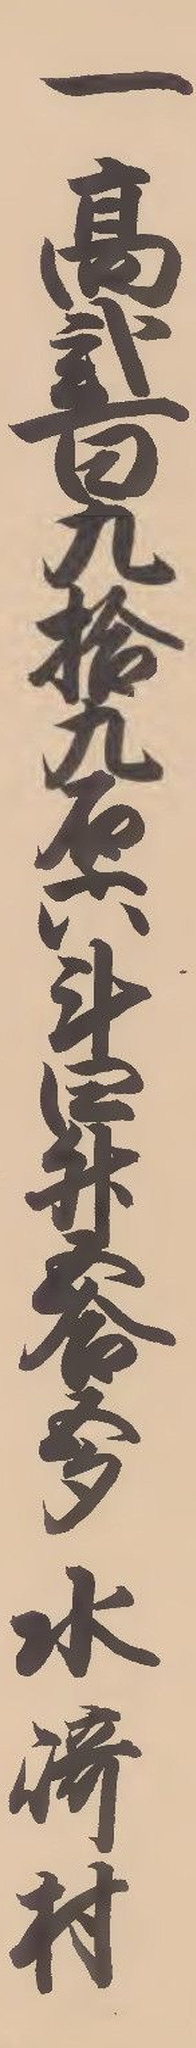一髙弐百九拾九石六斗四升五合五夕水崎村
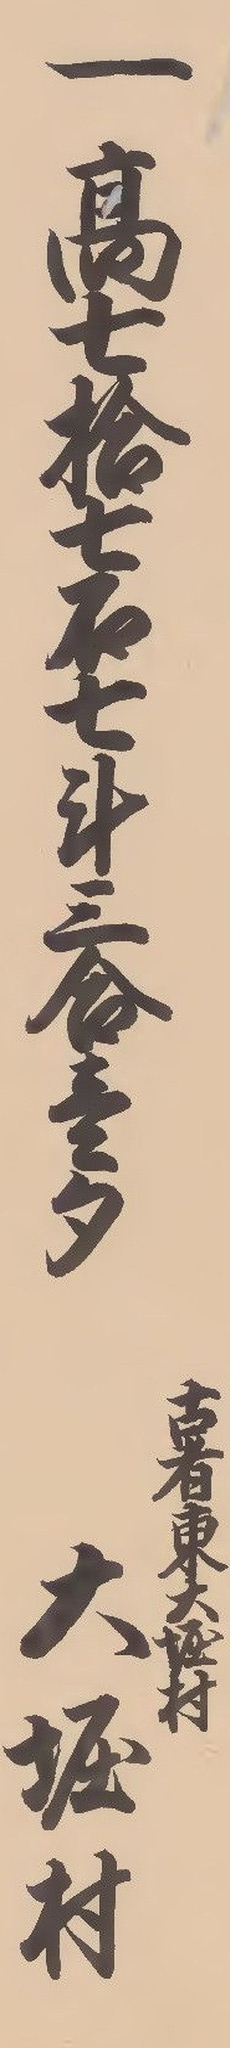一髙七拾七石七斗三合壱夕大堀村
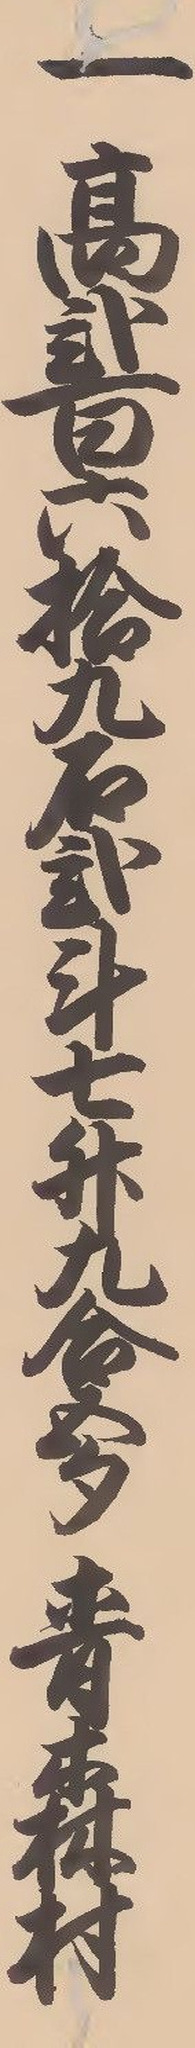一髙弐百六拾九石弐斗七升九合五夕青森村
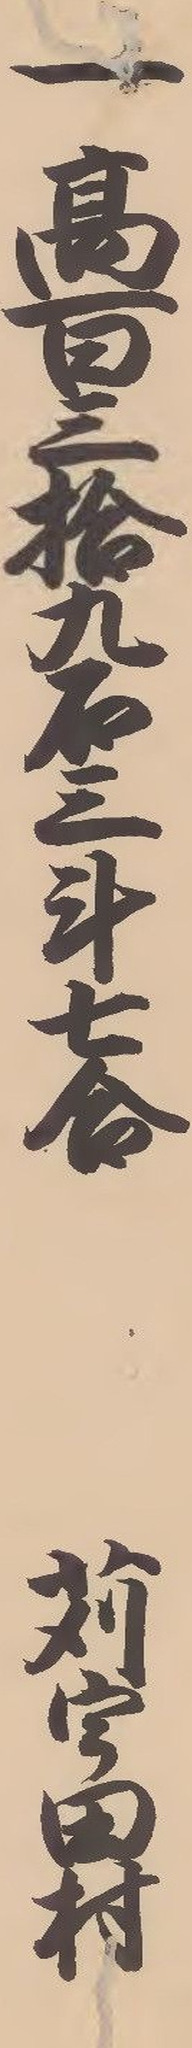一髙百三拾九石三斗七合苅宇田村
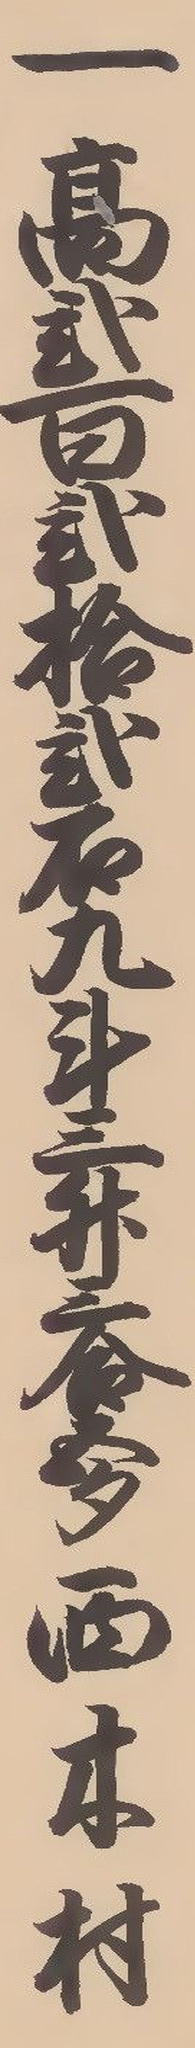一髙弐百弐拾壱石九斗三升三合五夕西木村
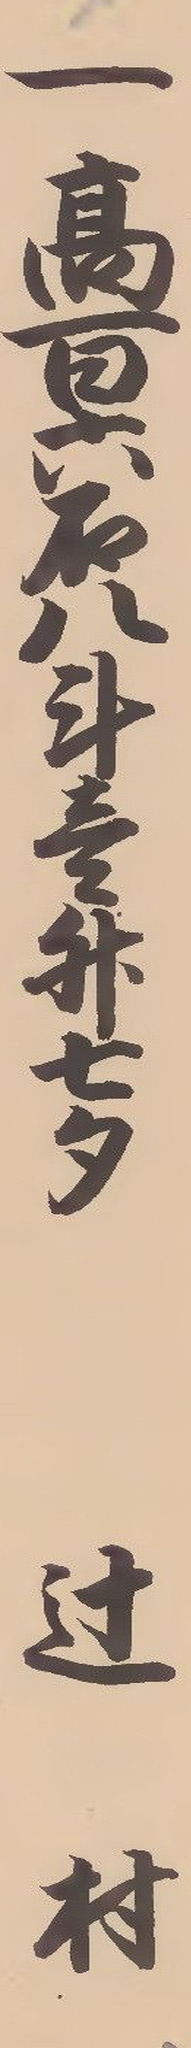一髙百六石八斗壱升七夕辻村
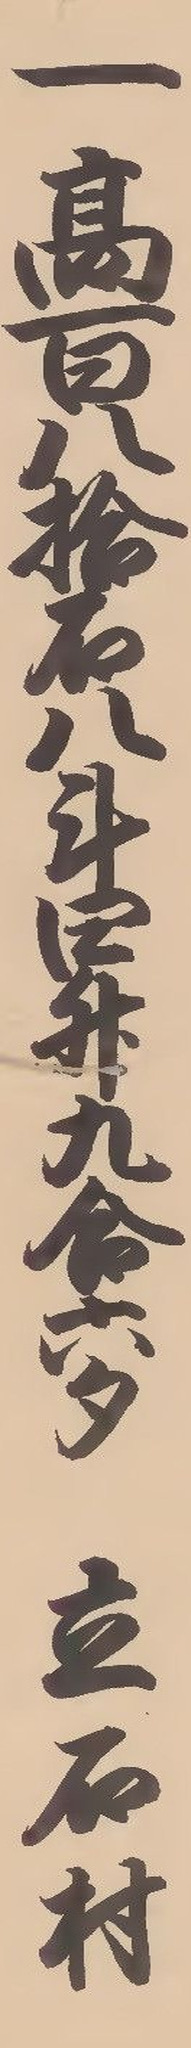一髙百八拾石八斗四升九合六夕立石村
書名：豊前国郷帳
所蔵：国立公文書館 National Archives of Japan
